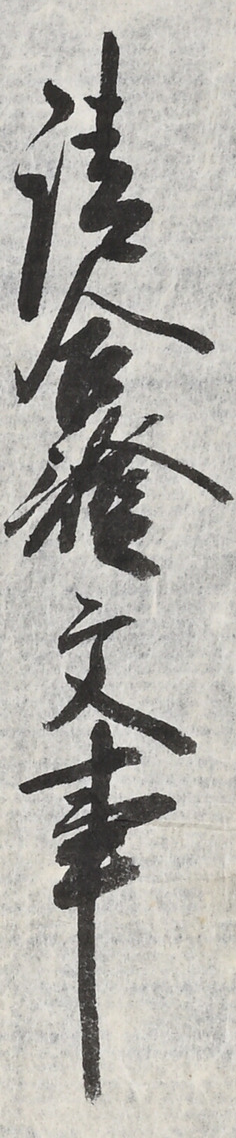請合証文事
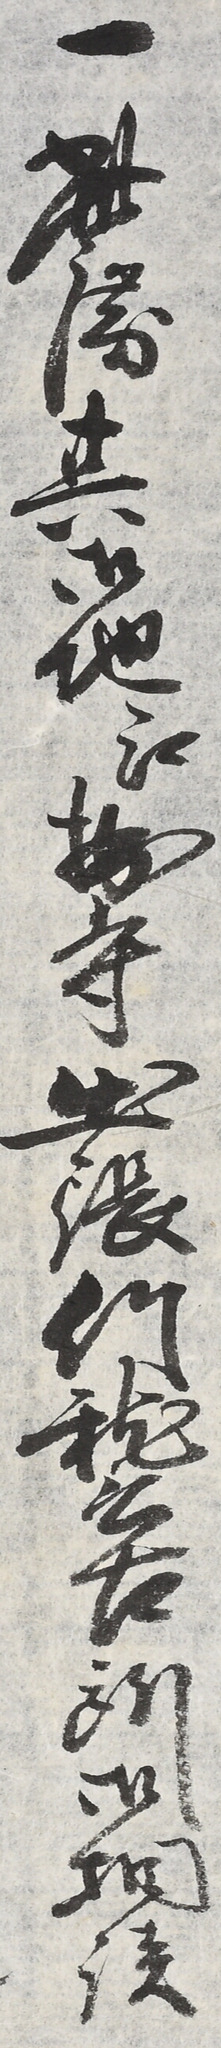一此度其御地江拙寺出張行稽古所御相談
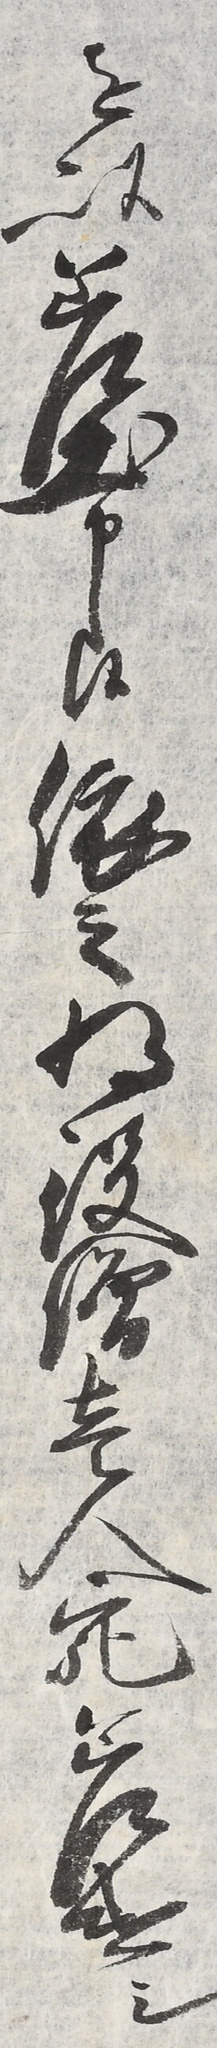を以差出申候依之為役僧壱人宛差遣シ
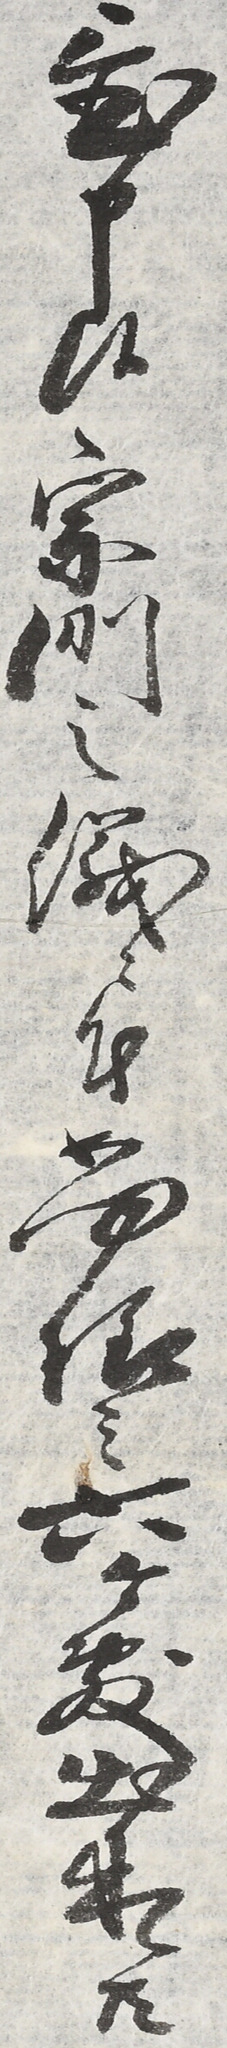置申候宗町之儀ニ付如何様之六之敷出来候共
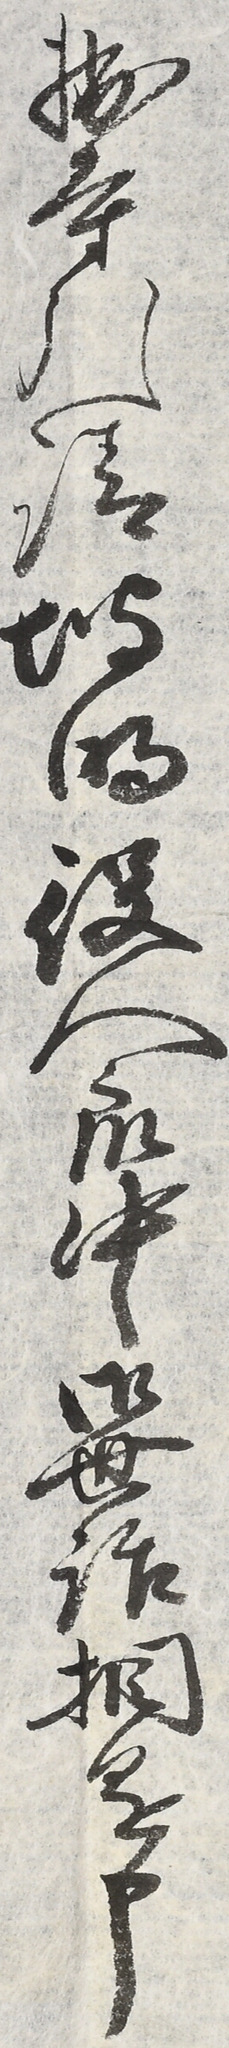拙寺引請埒明役人衆中御世話相懸申
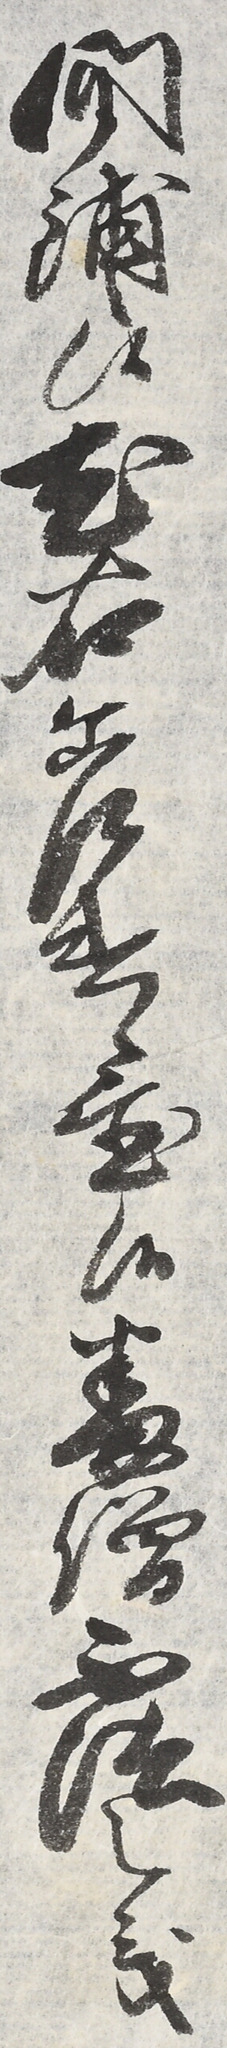間敷候尤右差遣置候番僧不法之義
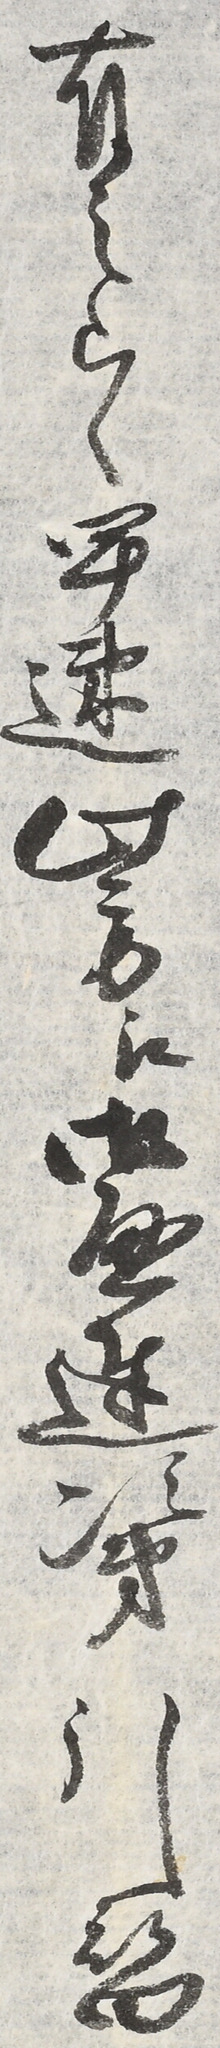有之候ハヽ早速此方江御通達次第引替
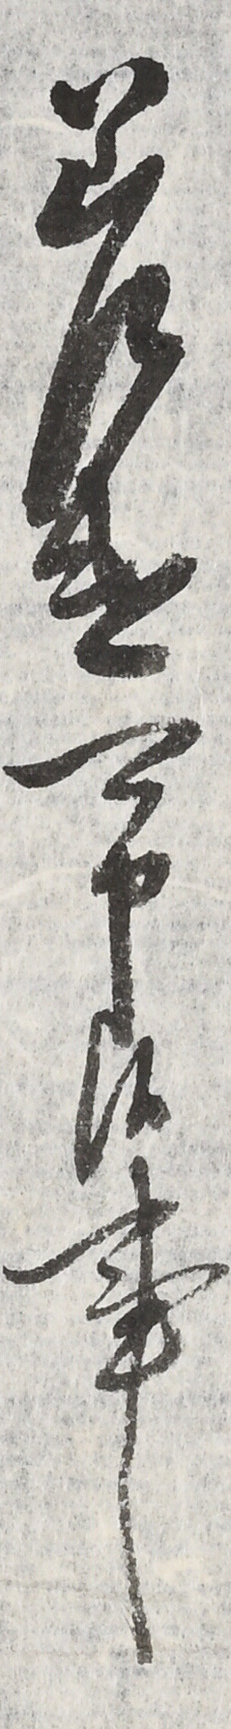差遣可申候事
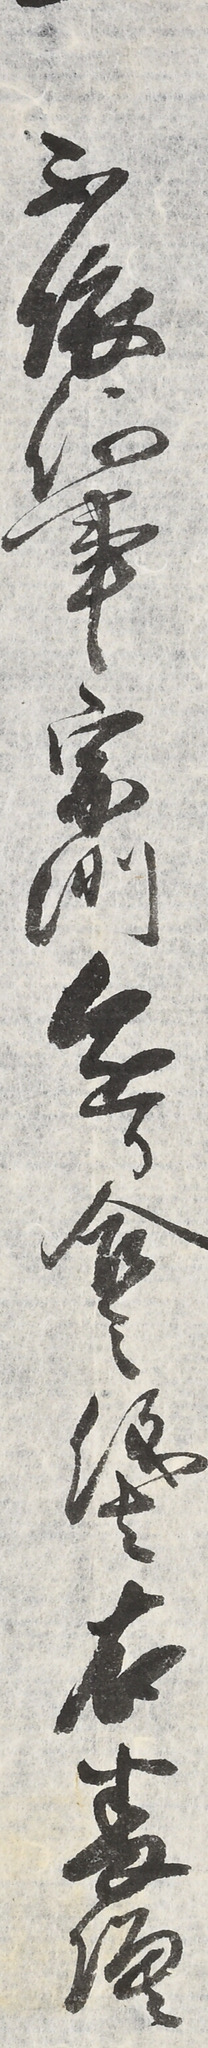一不依何事宗門懸り合之儀は右番僧
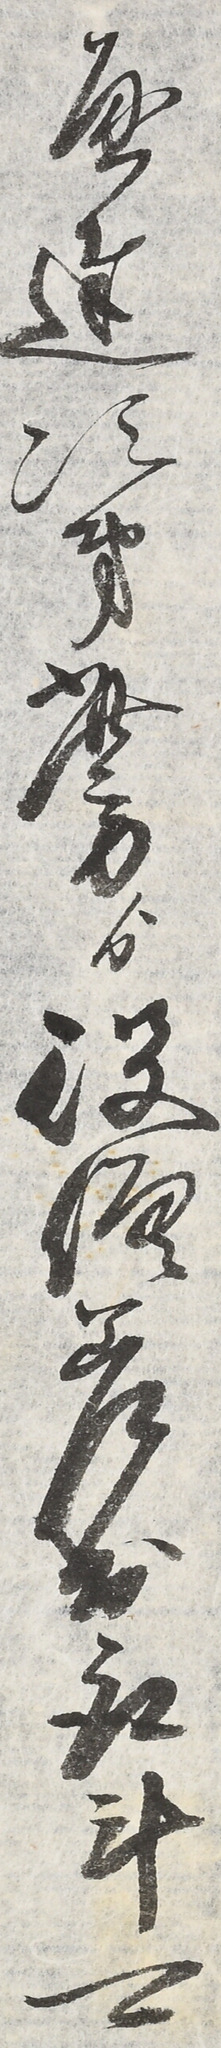通達次第此方ゟ役僧差出取計可
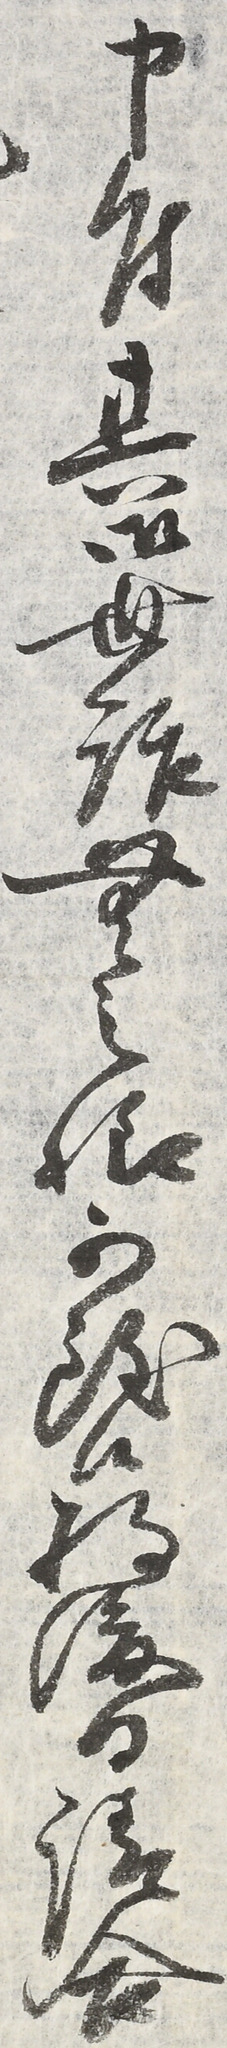申付其御世話無之様可致候明後日請合
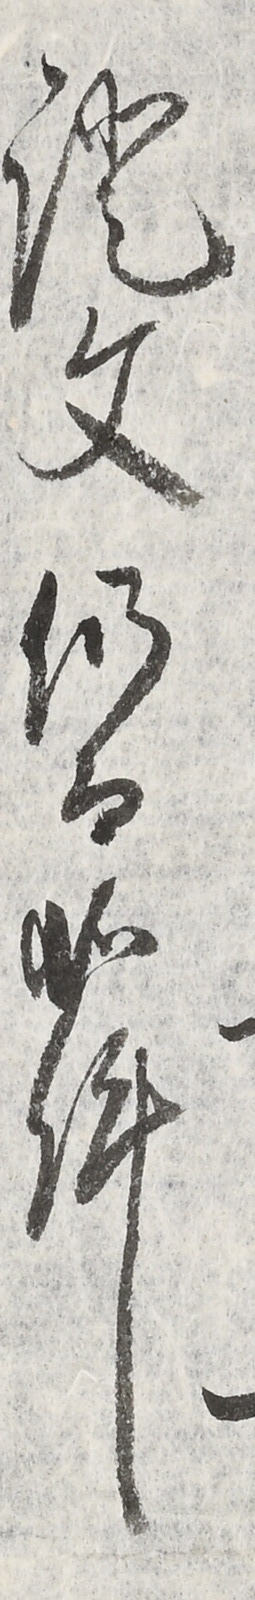証文仍而如件
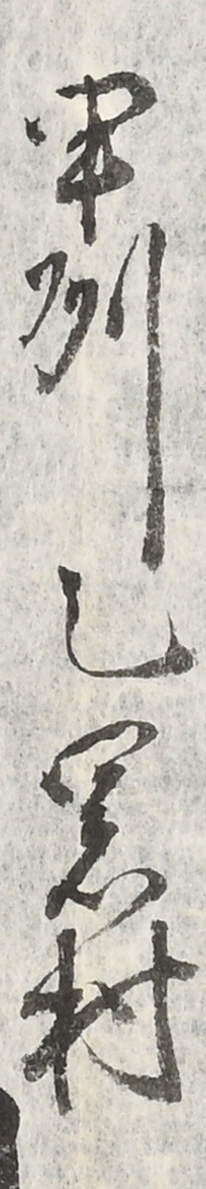甲州乙黒村
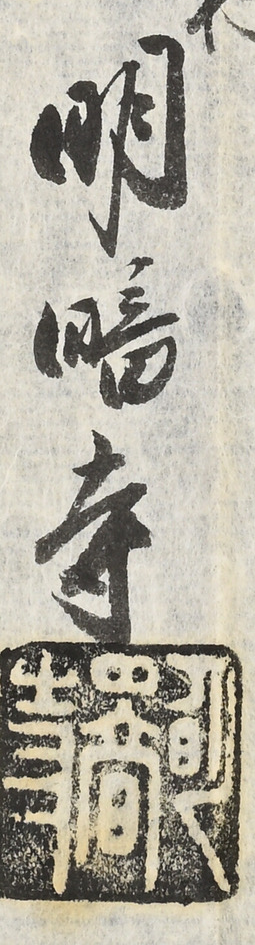明暗寺㊞
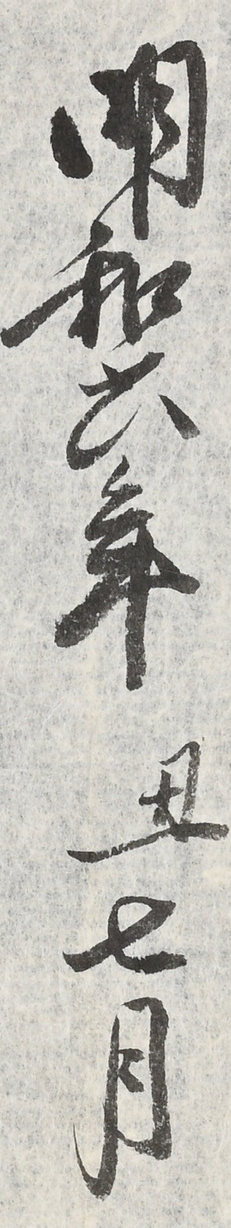明和六年丑七月
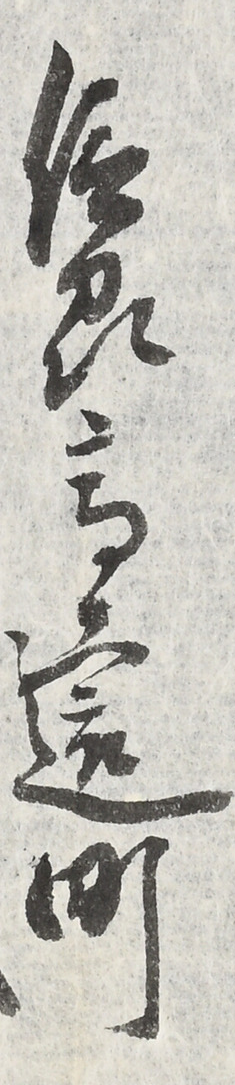信州高遠町
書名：請合證文之事
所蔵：伊那市立高遠町図書館・合同会社AMANE
